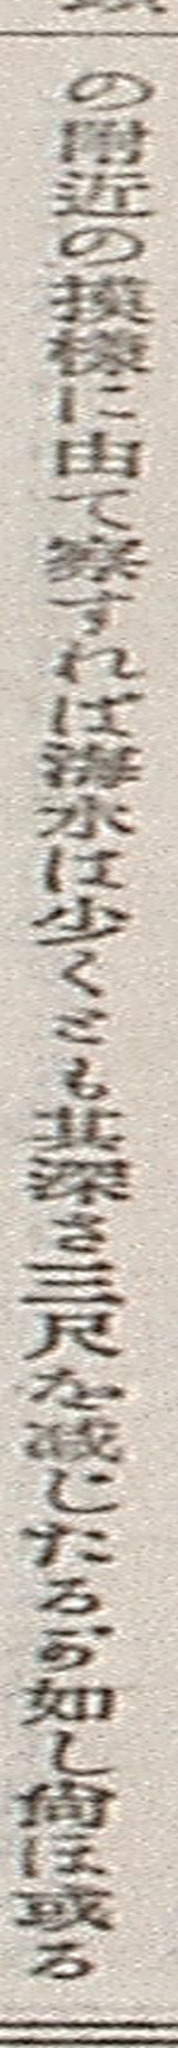の付近の模様に由て察すれば海水は少くとも其深さ三尺を減じたるが如し尚ほ或る
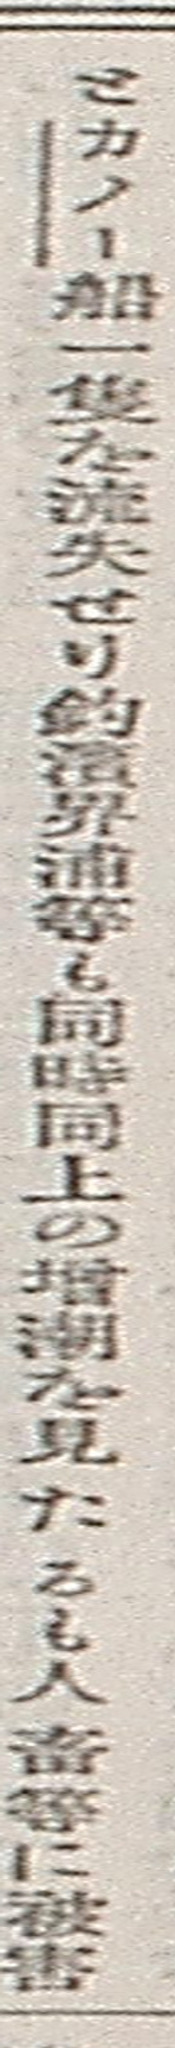とカノー船一隻を流失せり釣浜界浦等も同時同上の増潮を見たるも人畜等に被害
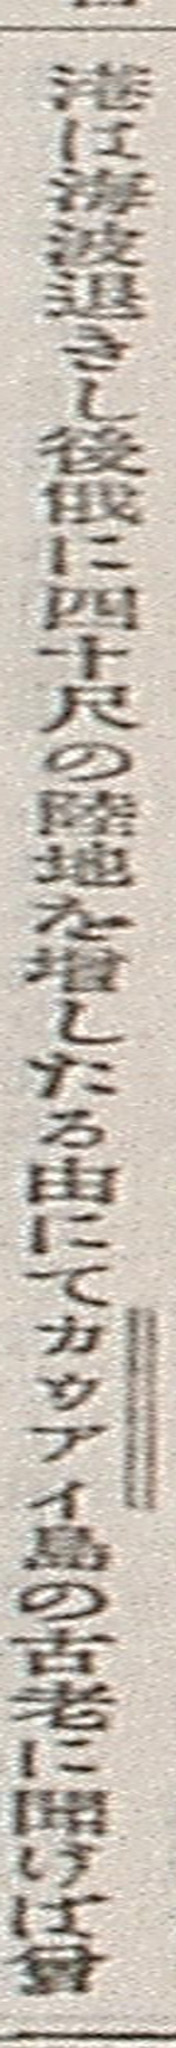港は海波退きし後俄に四十尺の陸地を増したる由にてカウアイ島の古老に聞けば曾
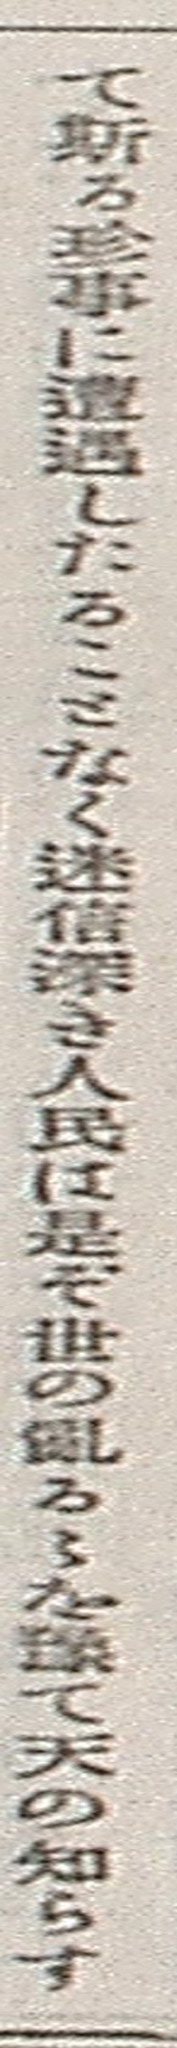て斯る珍事に遭遇したることなく迷信深き人民は是ぞ世の乱るゝを予て天の知らす
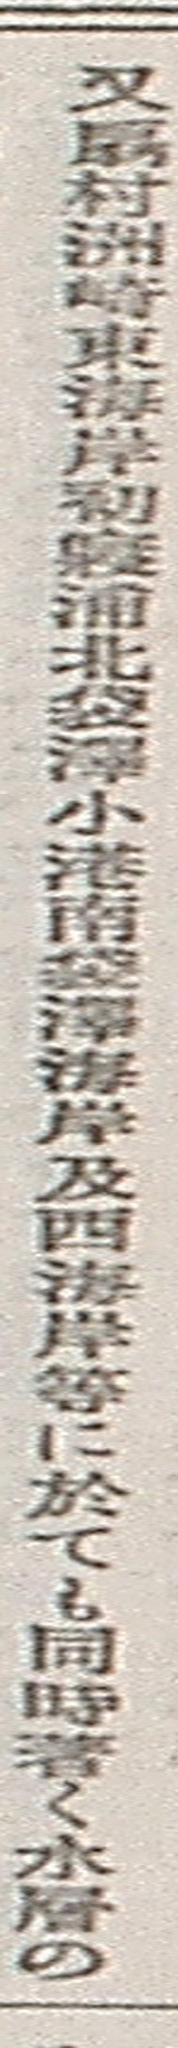又扇村洲崎東海岸初寝浦北袋沢小港南袋沢海岸及西海岸等に於ても同時著く水層の
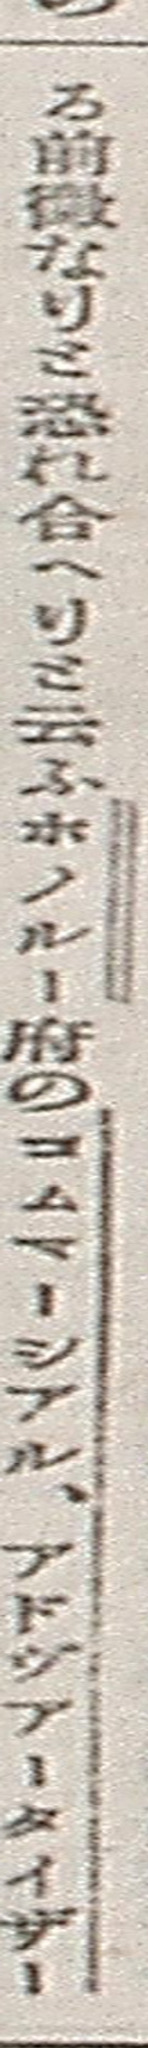る前徴なりと恐れ合へりと云ふホノルー府のコムマーシアル、アドヴァータイザー
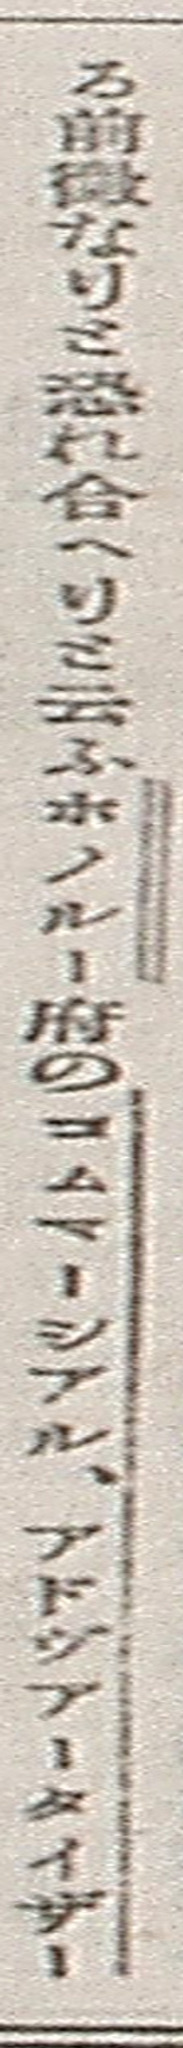る前徴なりと恐れ合へりと云ふホノルー府のコムマーシアル、アドヴァータイザー
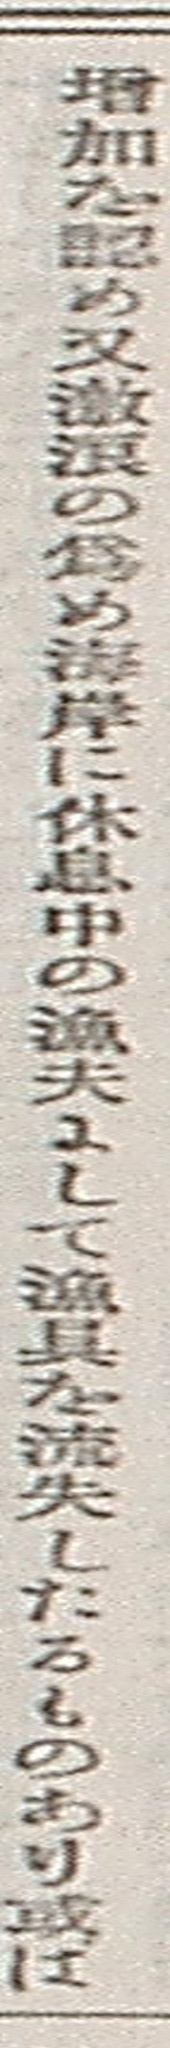増加を認め又激浪の為め海岸に休息中の漁夫にして漁具を流失したるものあり或は
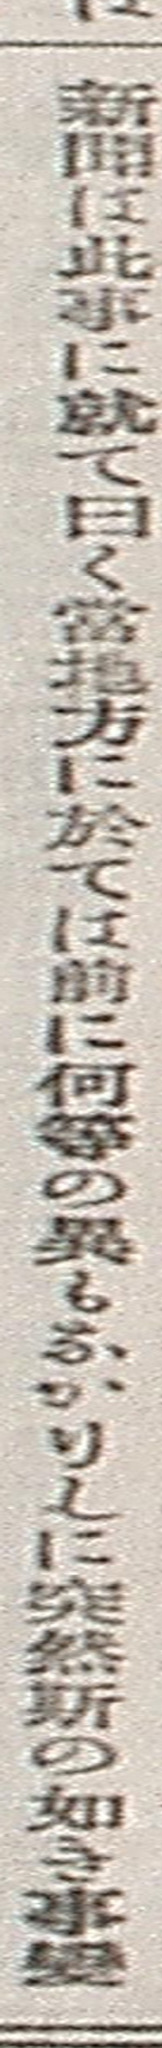新聞は此事に就て曰く当地方に於ては前に何等の異もなかりしに突然斯の如き事変
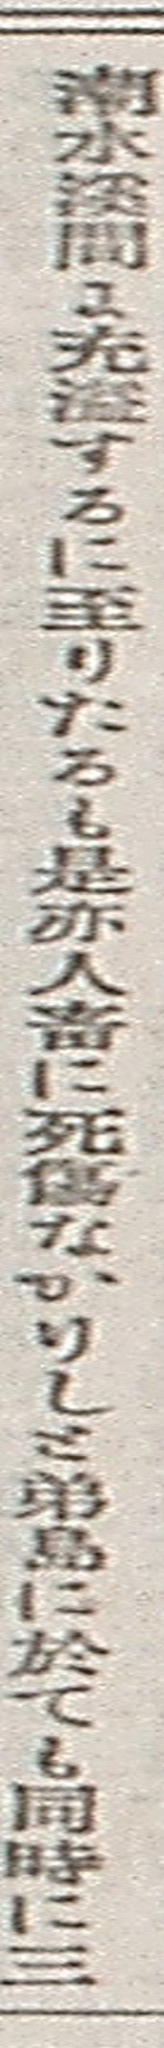潮水溪間に充溢するに至りたるも是亦人畜に死傷なかりしと弟島に於ても同時に三
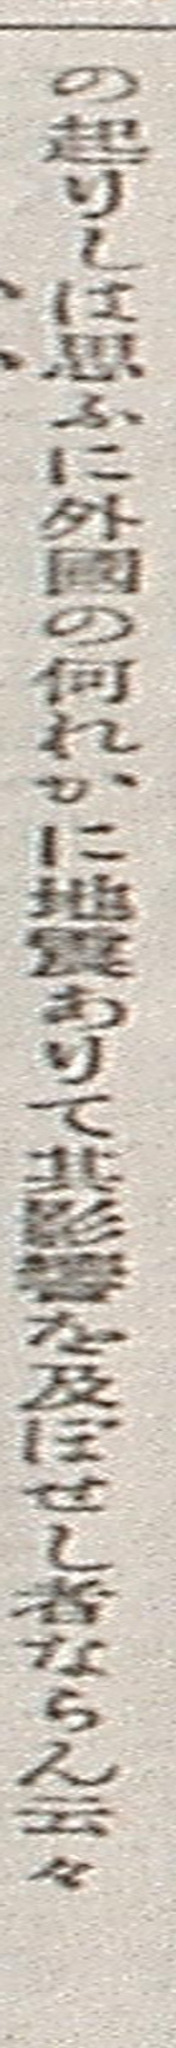の起りしは思ふに外国の何れかに地震ありて其影響を及ぼせし者ならん云々
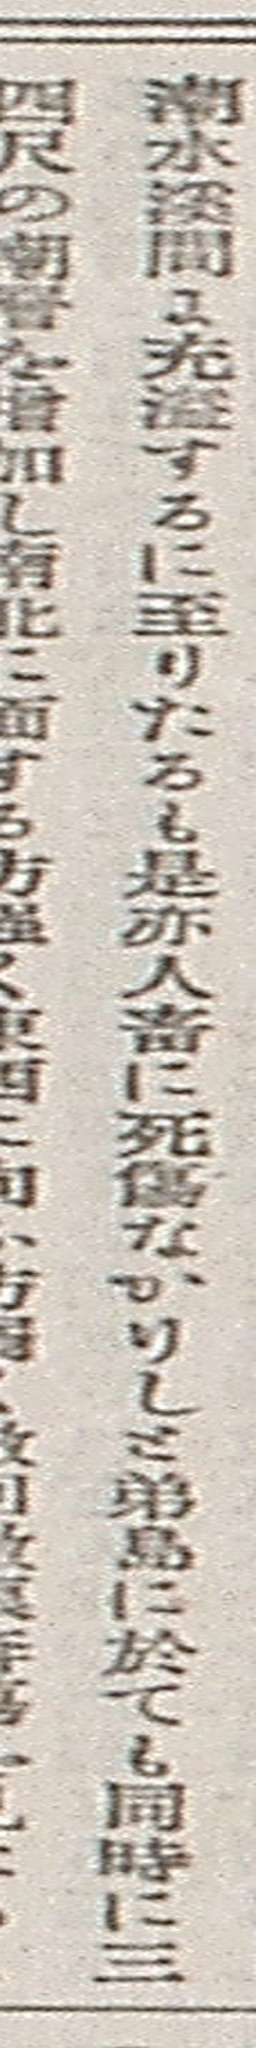四尺の潮層を増加し南北に面する方強く東西に向ふ方弱く数回激浪奔蕩を見たるも
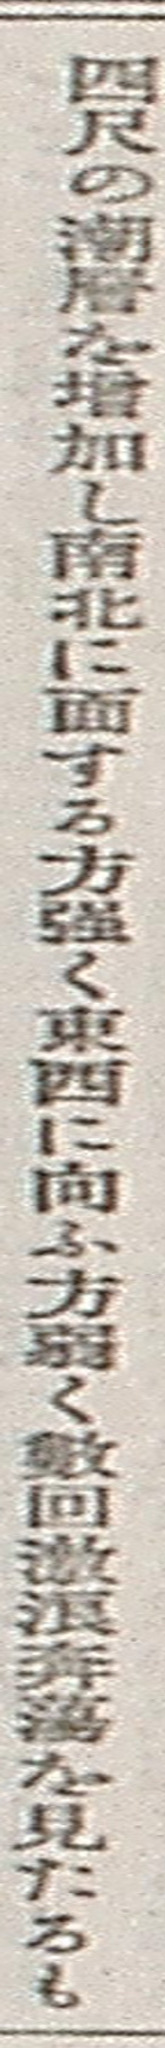四尺の潮層を増加し南北に面する方強く東西に向ふ方弱く数回激浪奔蕩を見たるも
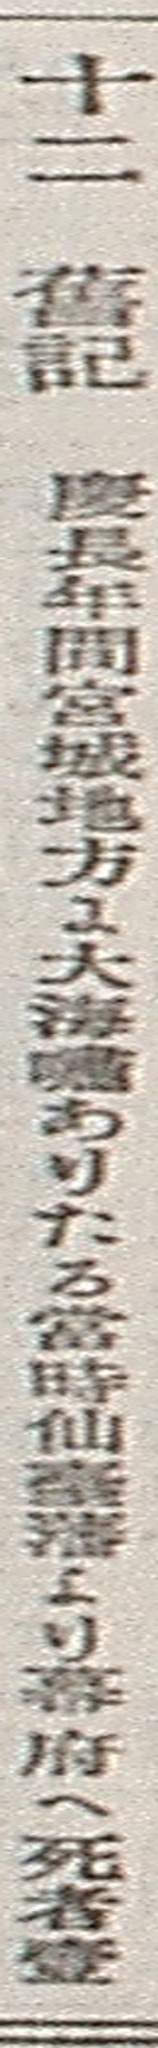十二旧記慶長年間宮城地方に大海嘯ありたる当時仙台藩より幕府へ死者壹
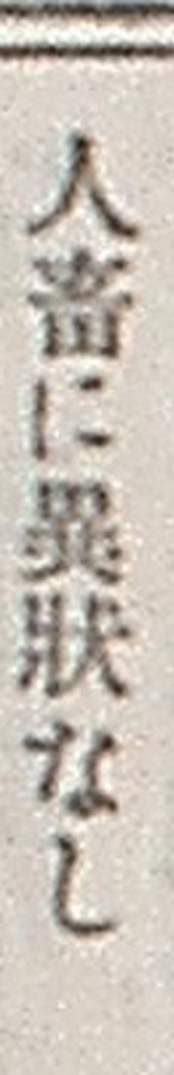人畜に異状なし
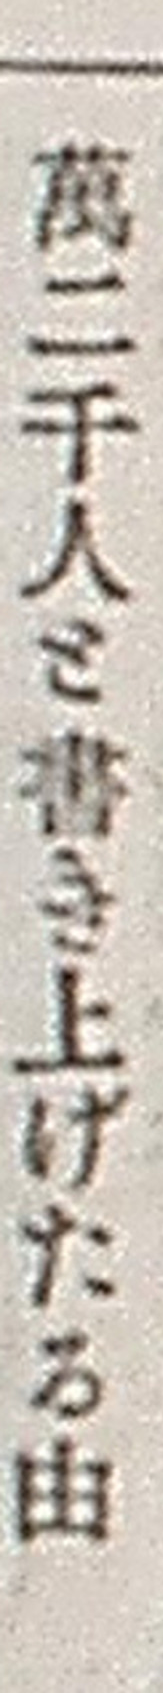万二千人と書き上げたる由
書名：風俗畫報臨時増刊第百十九號　大海嘯被害録（中）
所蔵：東京大学地震研究所図書室 Earthquake Research Institute Library, The University of Tokyo, JAPAN
